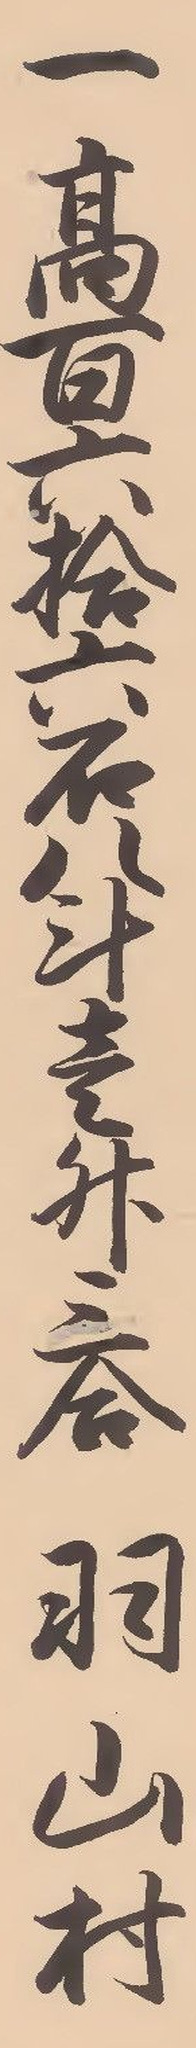一高百六拾六石八斗壱升三合羽山村

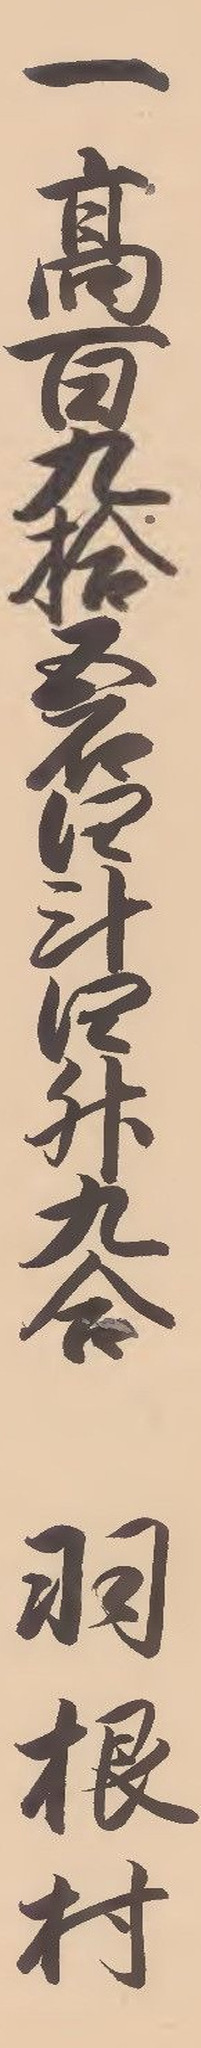一高百九拾五石四斗四升九合羽根村
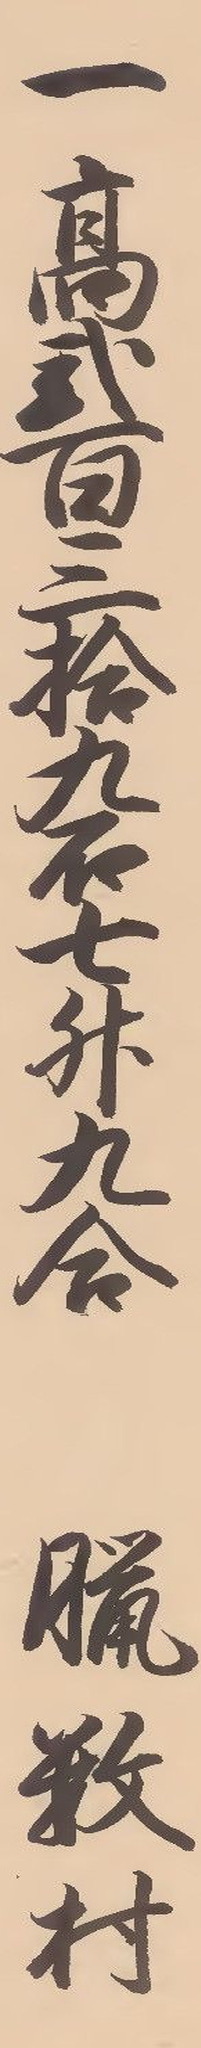一高弐百三拾九石七升九合臘数村
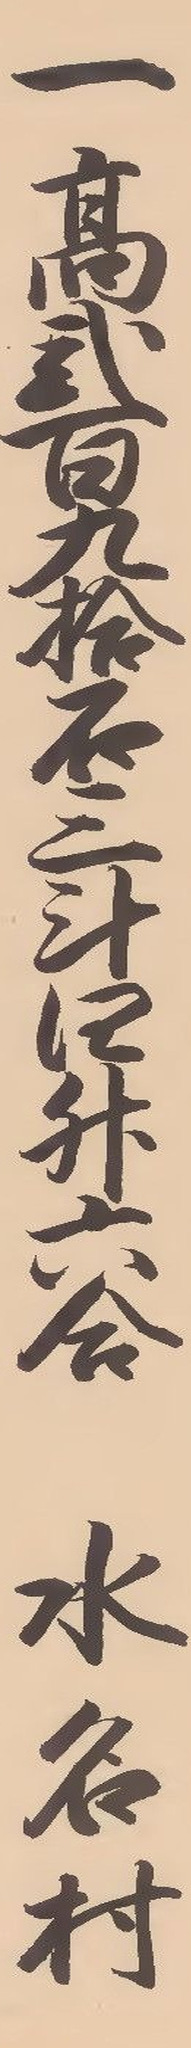一高弐百九拾石三斗四升六合水名村
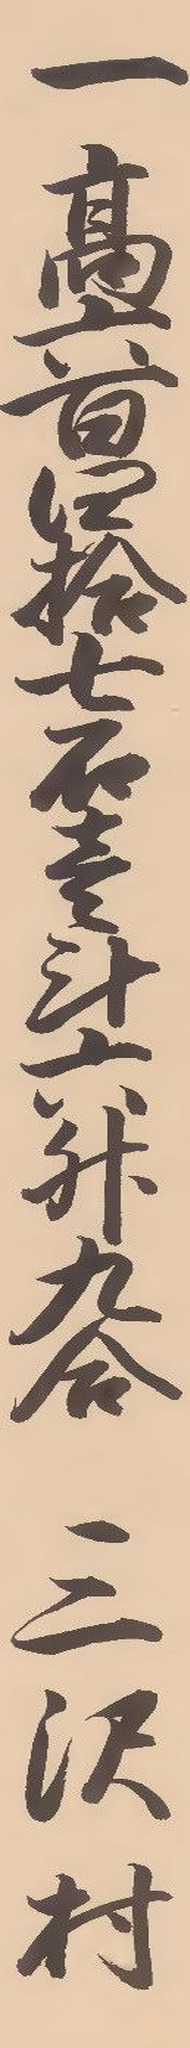一高六百四拾七石壱斗六升九合三沢村
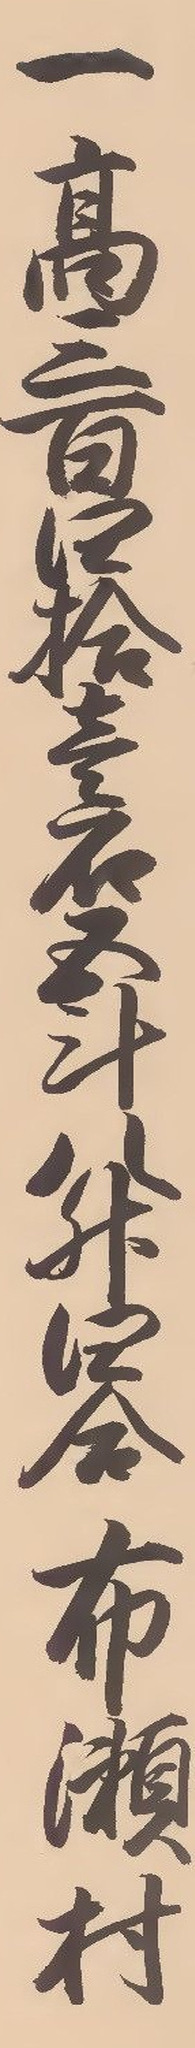一高三百四拾壱石五斗八升四合布瀬村
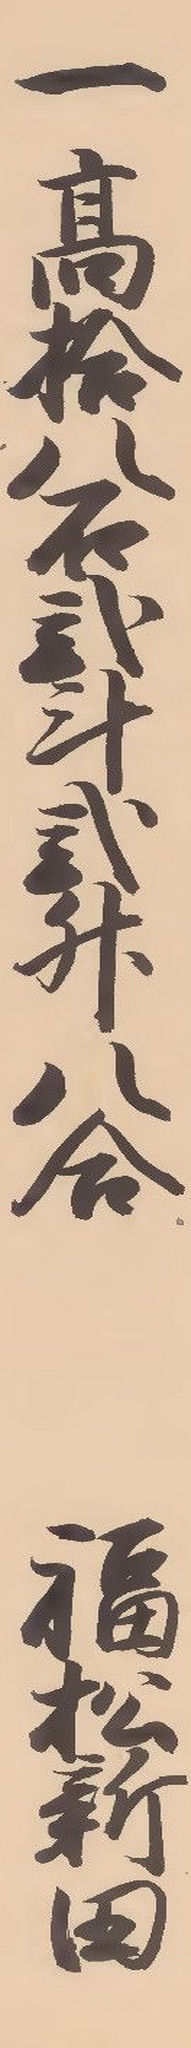一高拾八石弐斗弐升八合福松新田
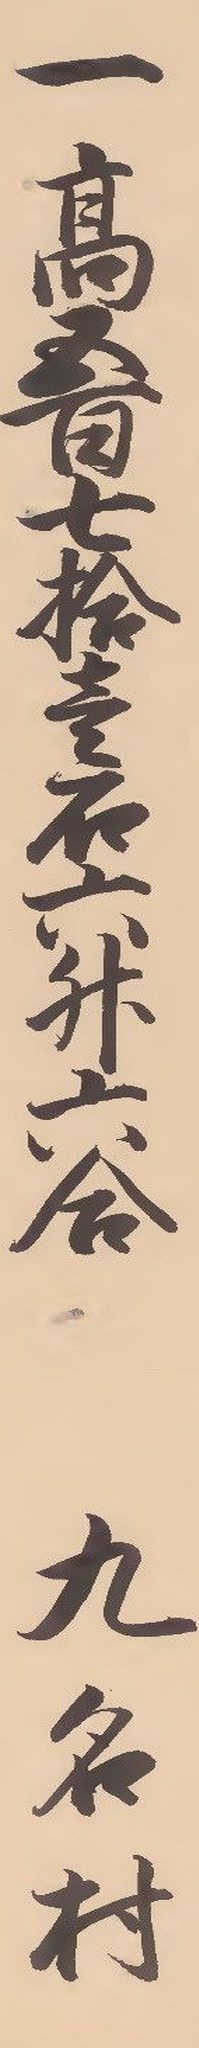一高五百七拾壱石六升六合九名村

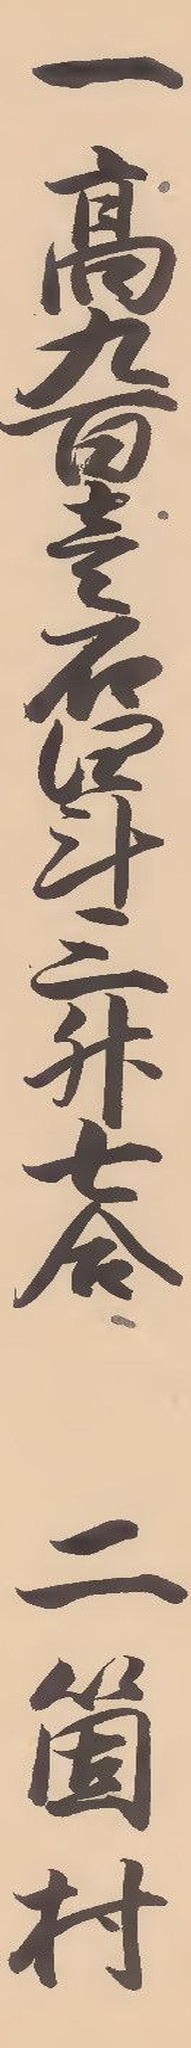一高九百壱石四斗三升七合二箇村
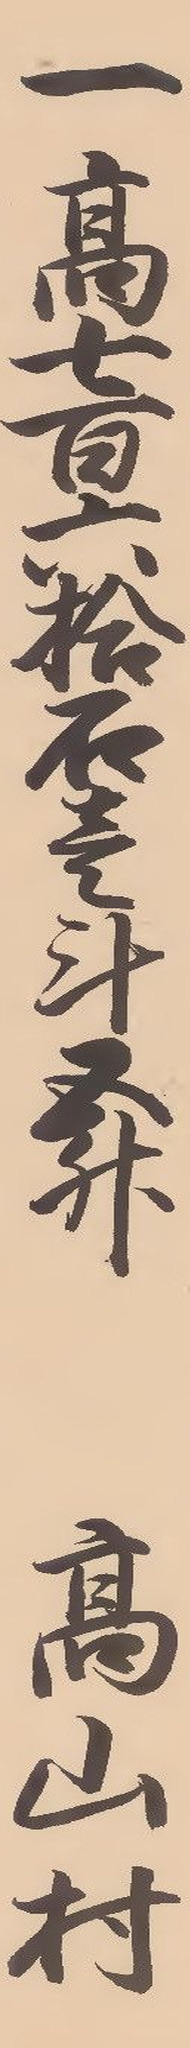一高七百六拾石壱斗五升高山村
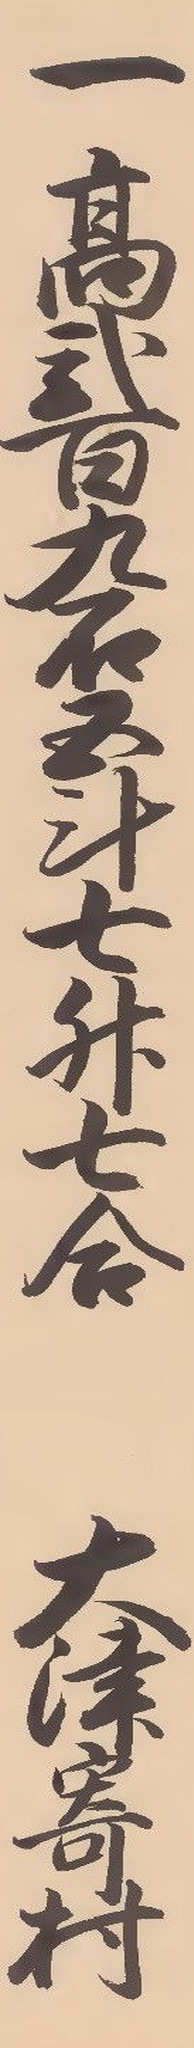一高弐百九石五斗七升七合大津寄村
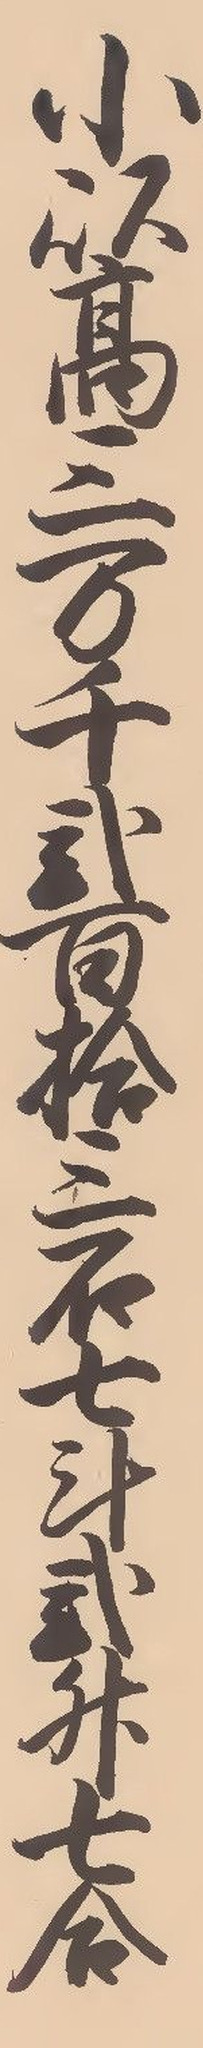小以高三万千弐百拾三石七斗弐升七合

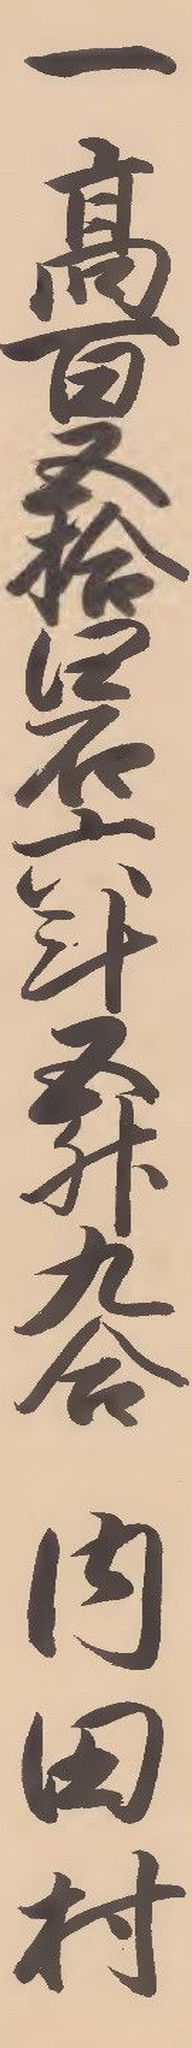一高百五拾四石六斗五升九合内田村
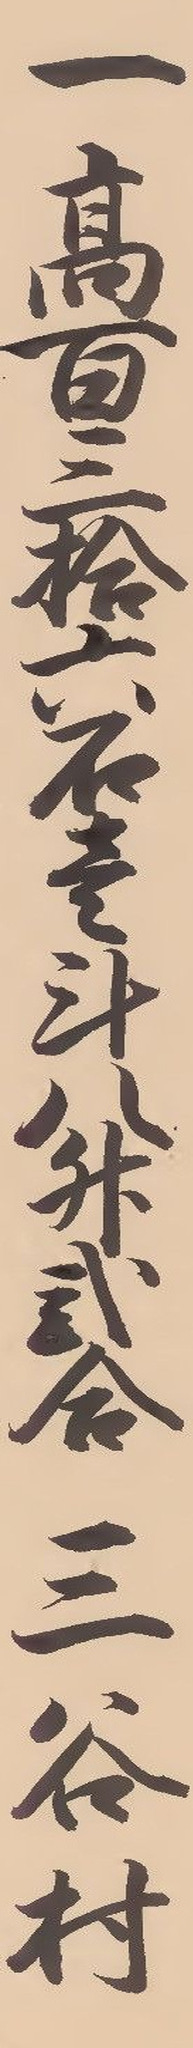一高百三拾六石壱斗八升弐合三谷村
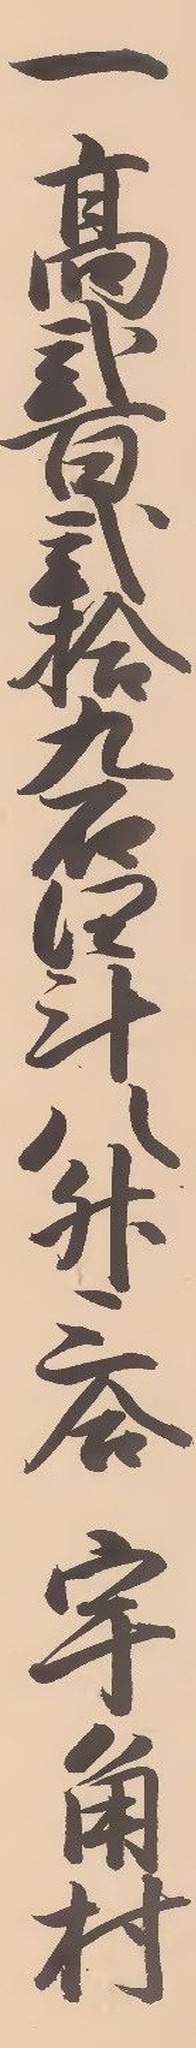一高弐百弐拾九石四斗八升三合宇角村
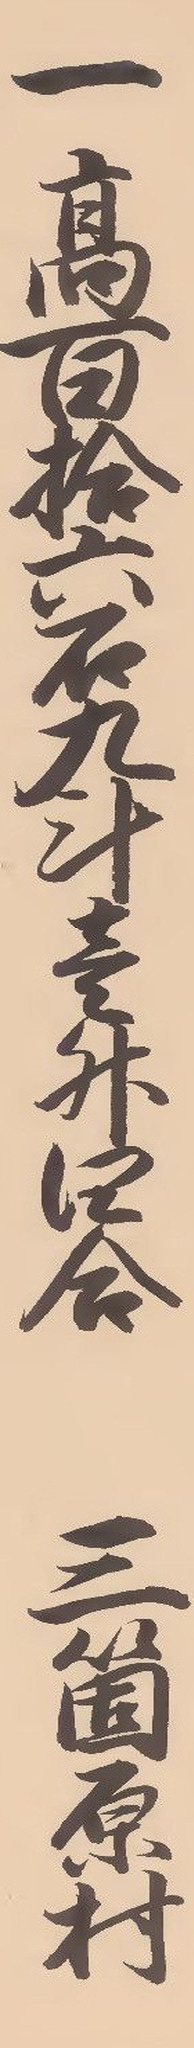一高百拾六石九斗壱升四合三箇原村
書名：備中国郷帳
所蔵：国立公文書館 National Archives of Japan
